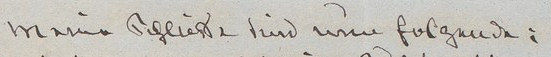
Meine Schlüsse sind nun folgende:
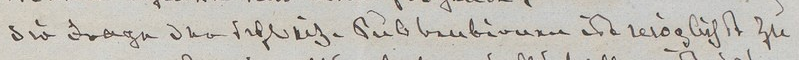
Die Frage der schweiz. Subventionen ist möglichst zu
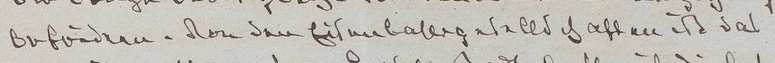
befördern. Von den Eisenbahngesellschaften ist das
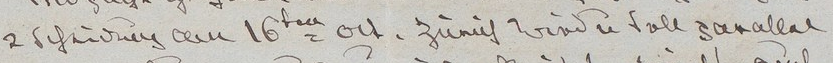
scheidung am 16ten Oct. Zürich wird u soll parallel
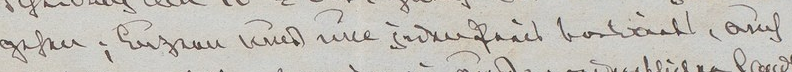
gehen; Luzern muß um jeden Preis vorwärts, auch
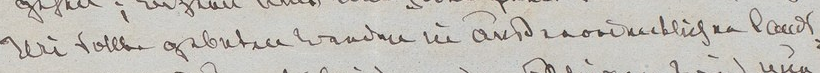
Uri sollte gebeten werden in ausserordentlicher Lands-
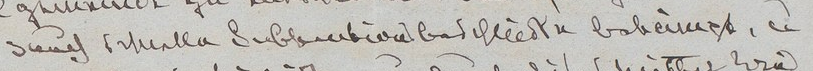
durch schnelle Subventionsbeschlüsse bekämpt, u
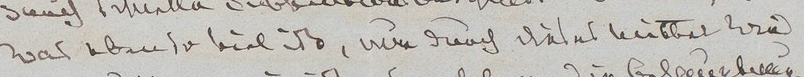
was ebenso viel ist, nur durch dieses Mittel wird
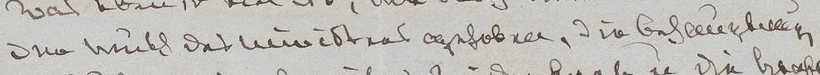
der Wunsch des Ministers gehoben, die Behauptungen
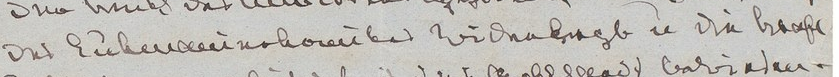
des Lukmanierkomites widerlegt u die Kraft
